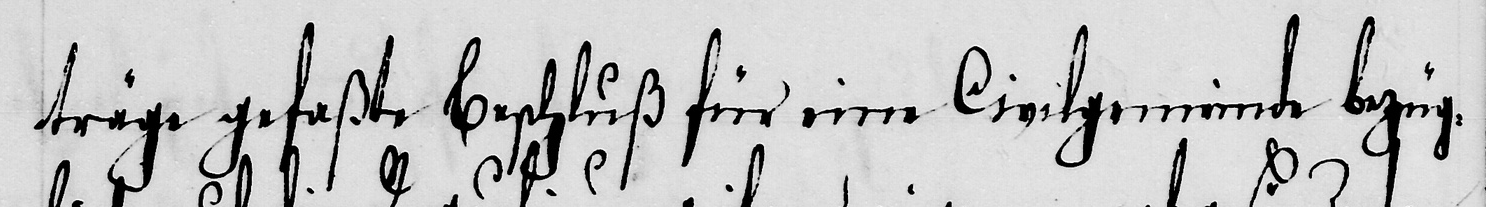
träge gefaßte Beschluß für eine Civilgemeinde bezüg¬
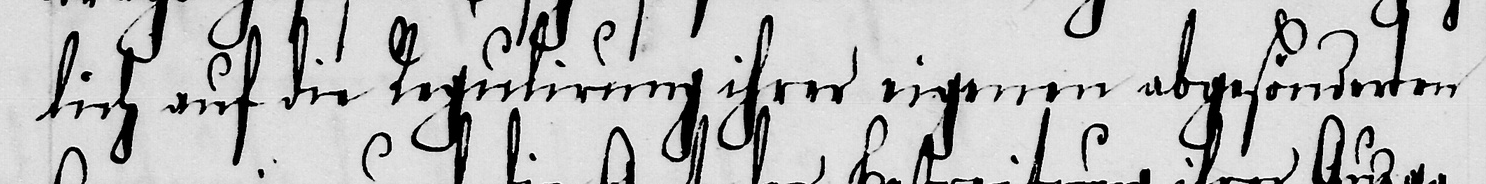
lich auf die Regulirung ihrer eigenen abgesönderten
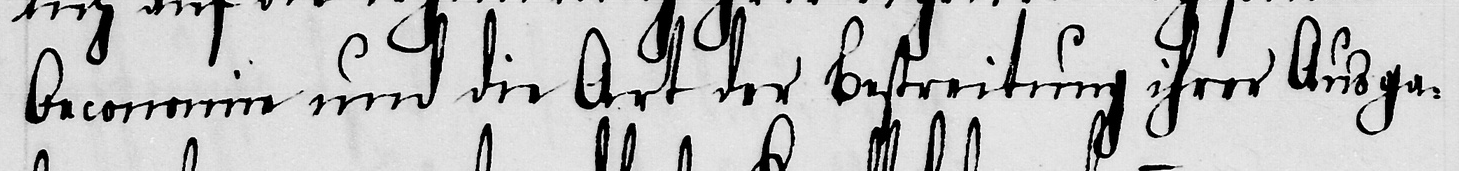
Oeconomie und die Art der Bestreitung ihrer Ausga¬
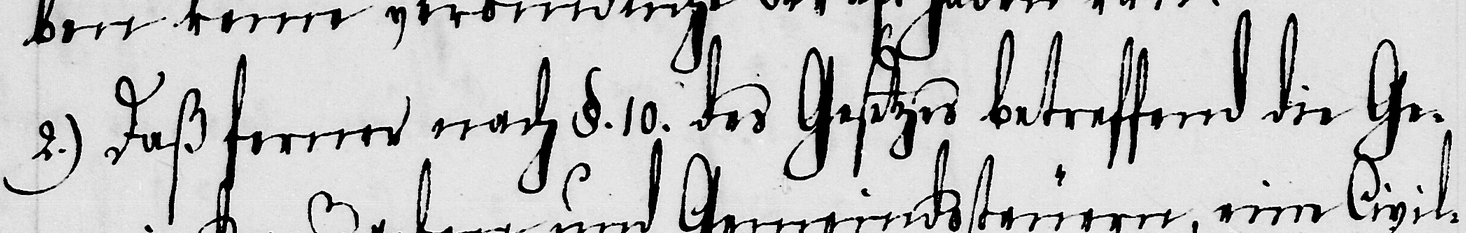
2.) Daß ferner nach §. 10. des Gesetzes betreffend die Ge¬
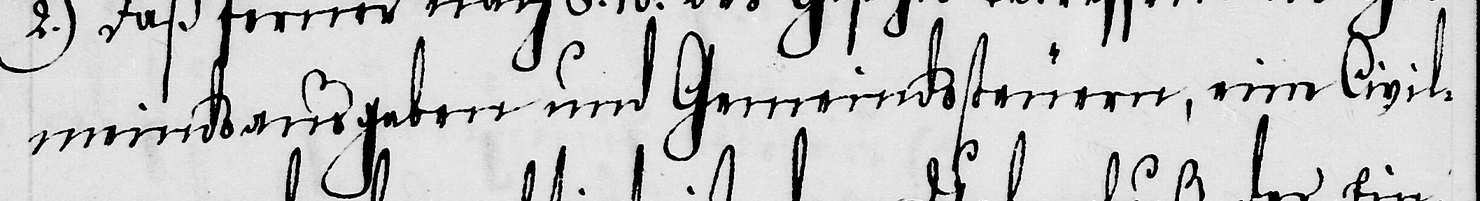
meindsausgaben und Gemeindssteuern, eine Civil¬
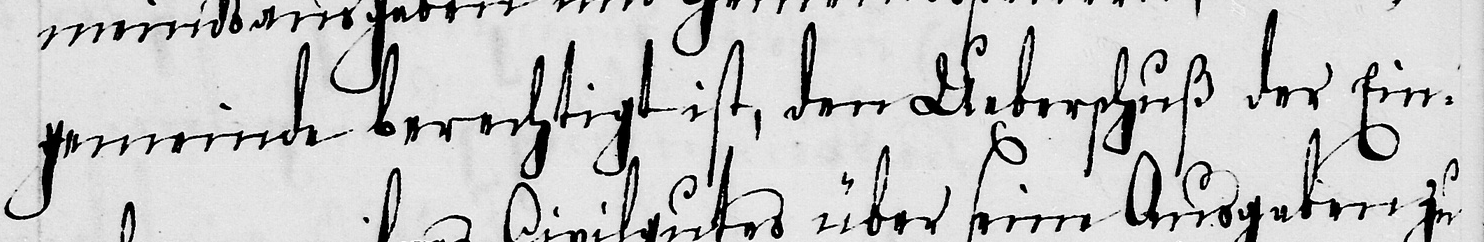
gemeinde berechtigt ist, den Ueberschuß der Ein¬
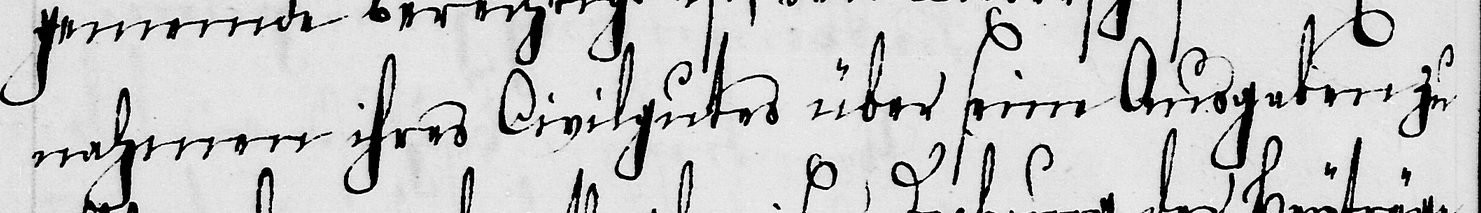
nahmen ihres Civilgutes über seine Ausgaben zu
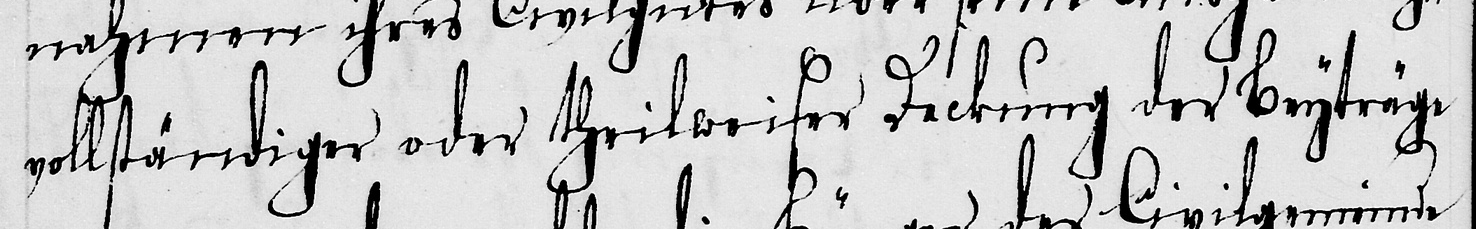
ollständiger oder theilweiser Deckung der Beyträge
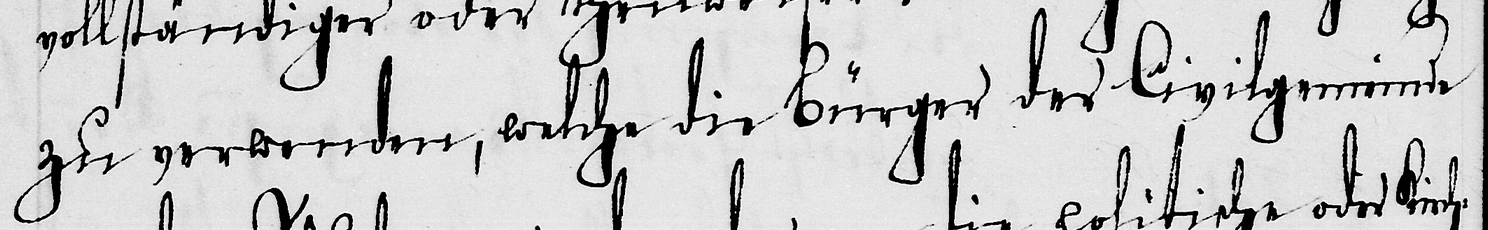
zu verwenden, welche die Bürger der Civilgemeinde
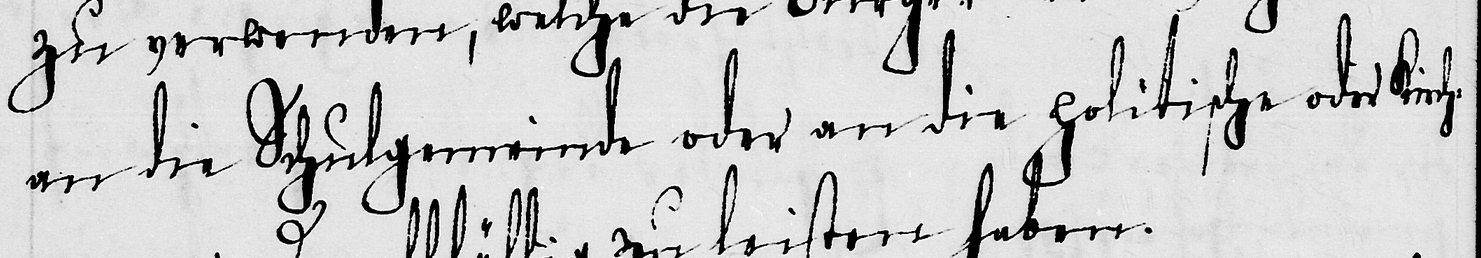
an die Schulgemeinde oder an die politische oder Ki¬
